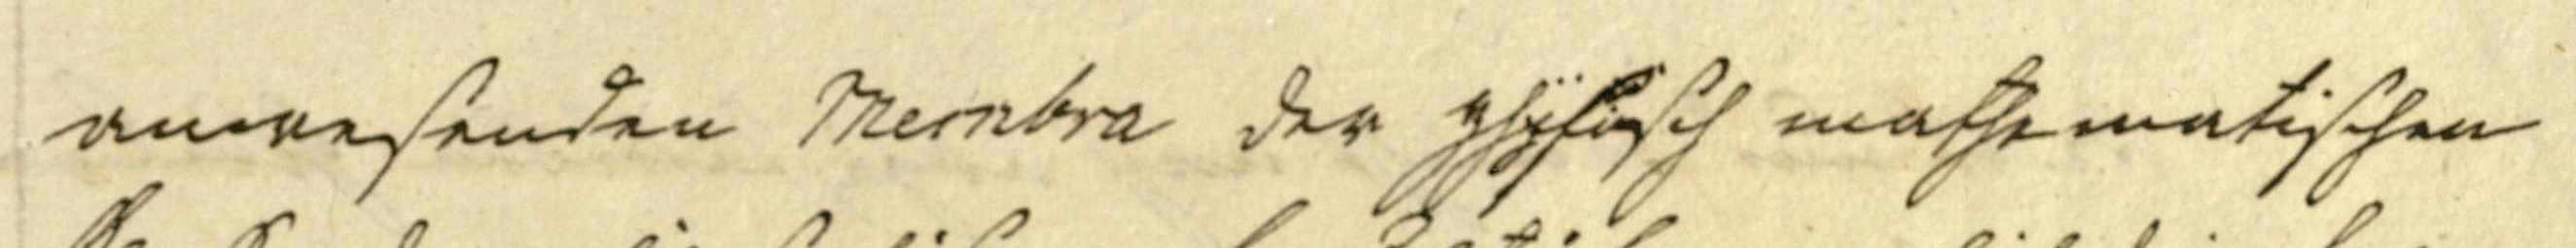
anwesenden Membra der phÿsisch mathematischen
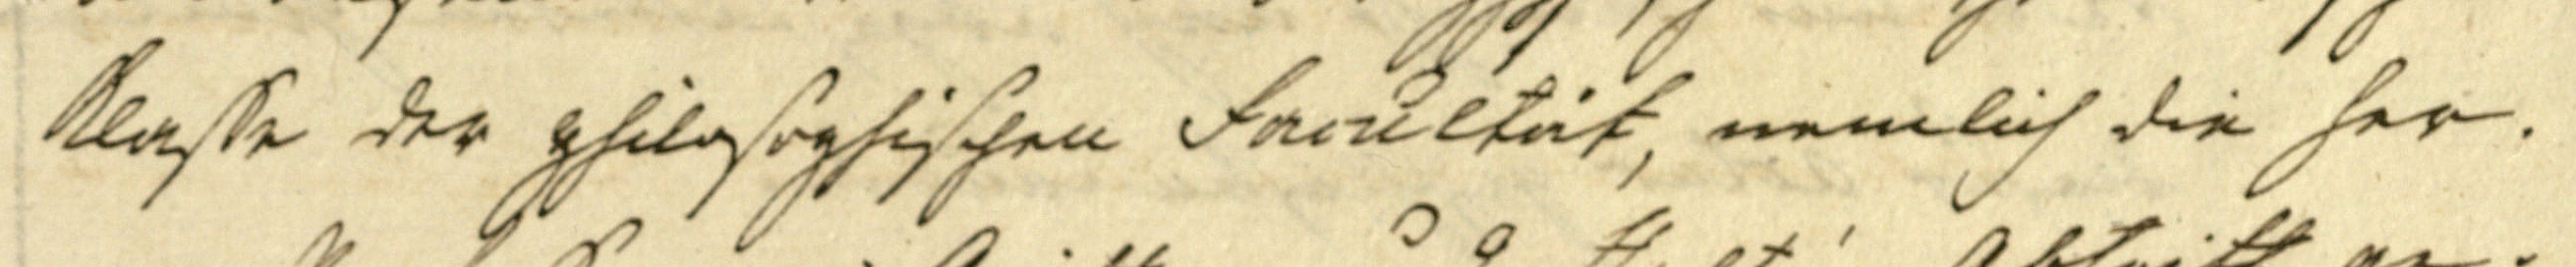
Klasse der philosophischen Facultät, nemlich die Her¬
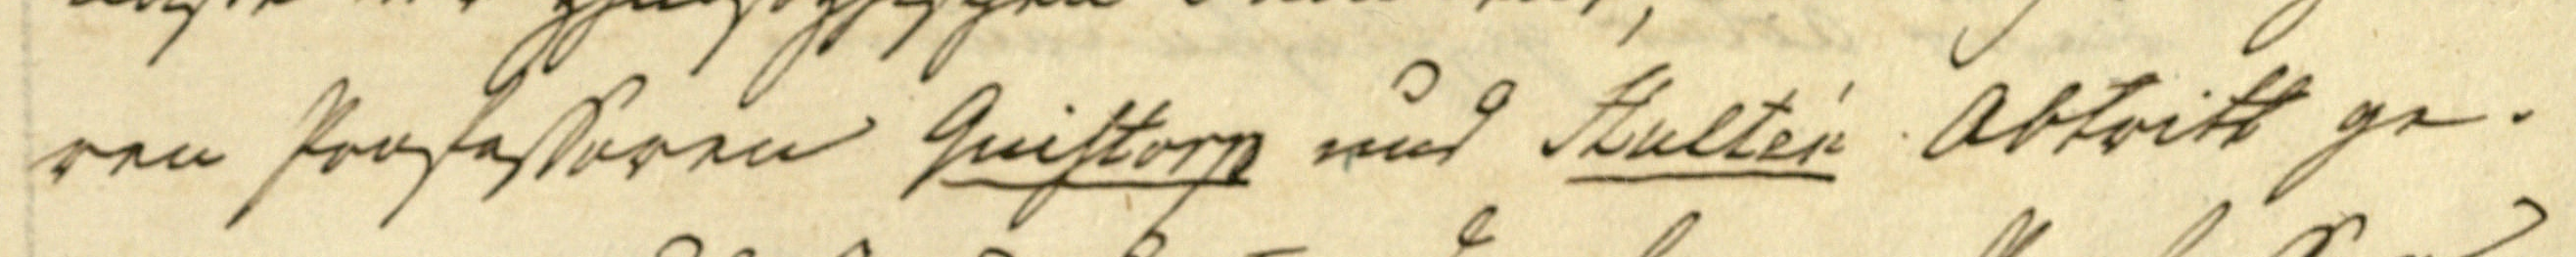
ren Professoren Quistorp und Hultén Abtritt ge¬
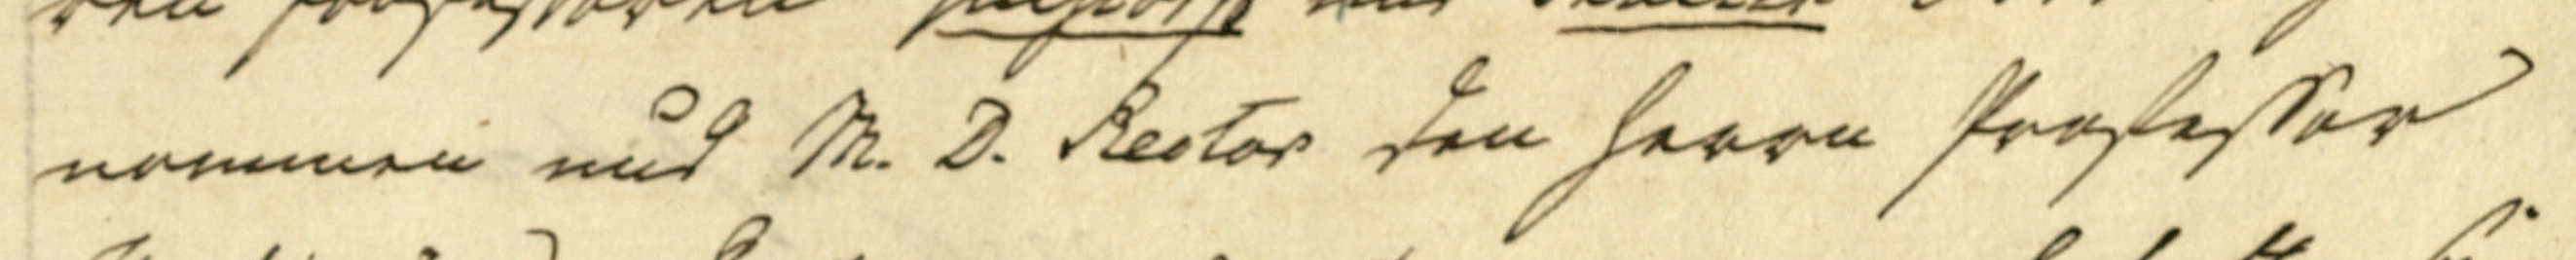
nommen und M. D. Rector den Herrn Professor
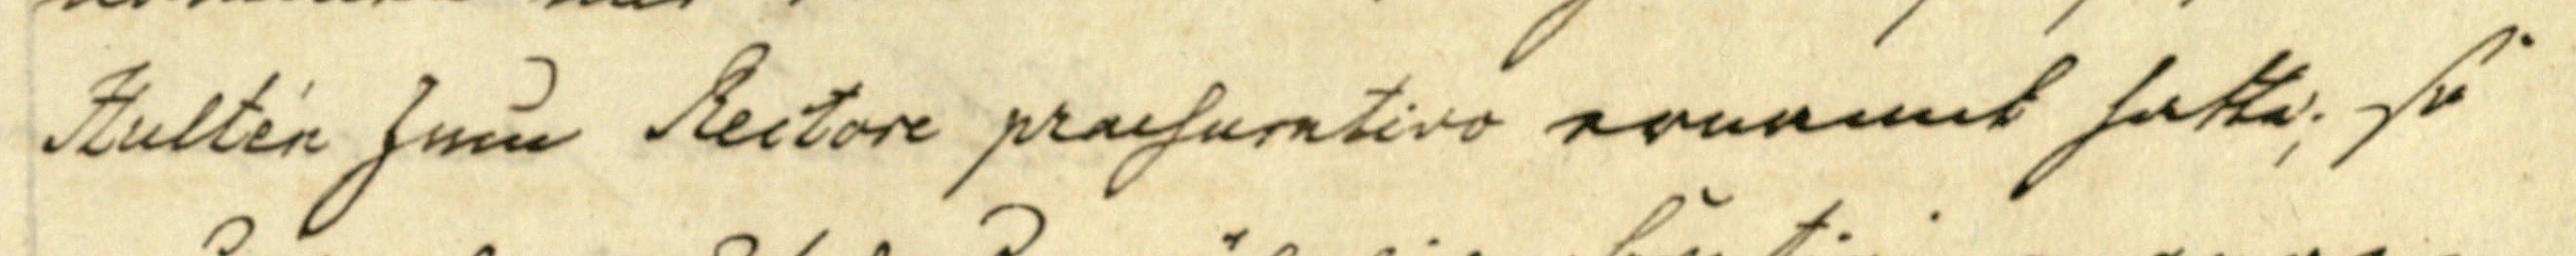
Hultén zum Rectore paesumtivo ernannt hatte; so
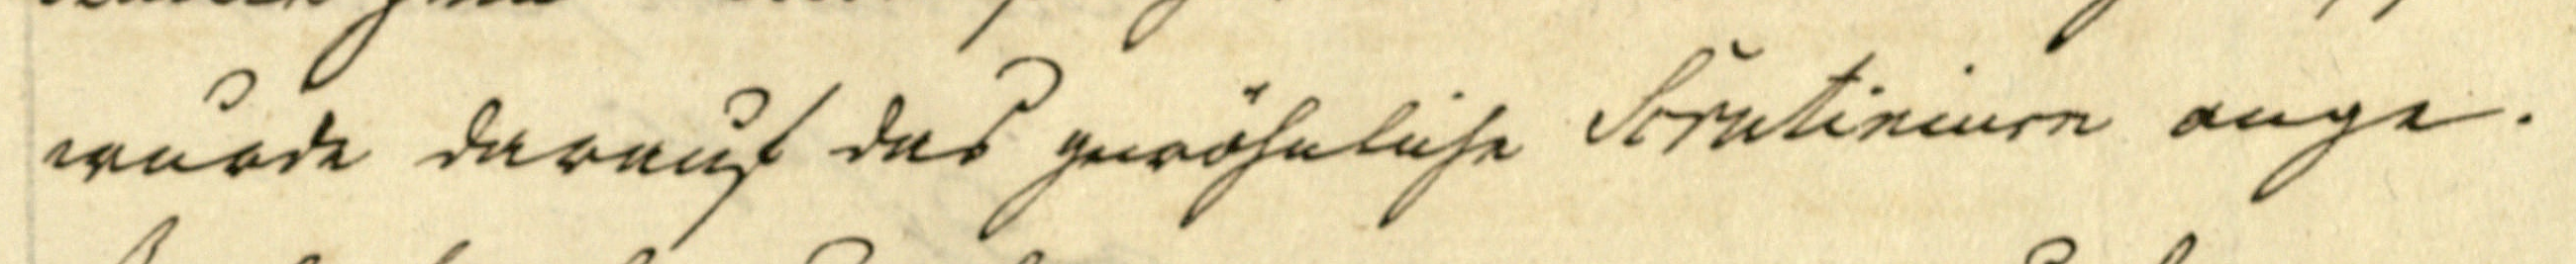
wurde darauf das gewöhnliche Scrutinium ange¬
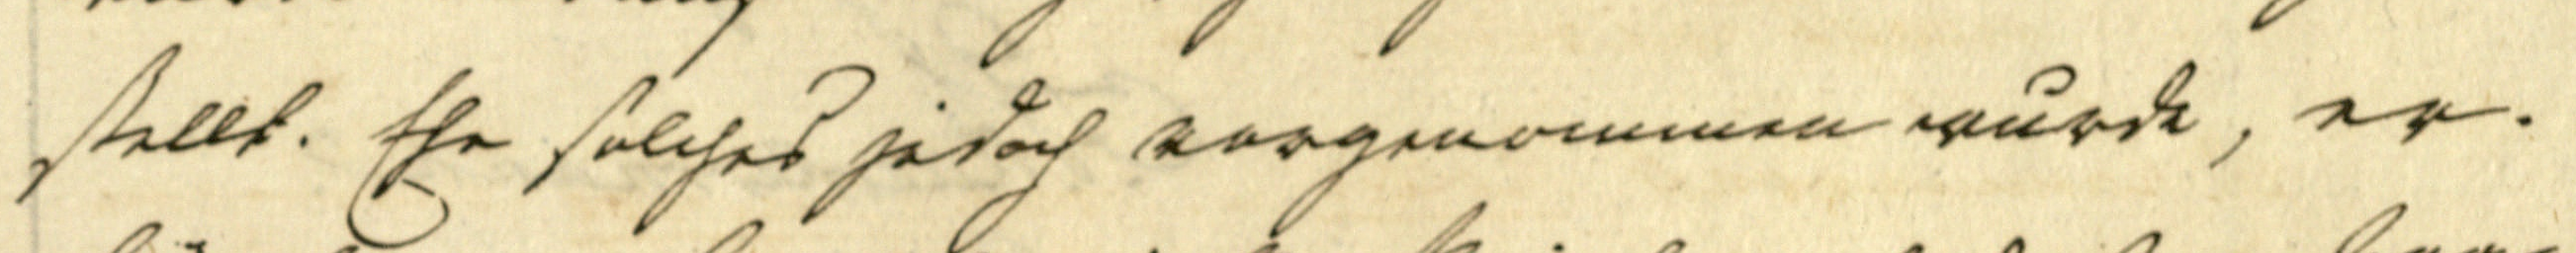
stellet. Ehe solches jedoch vorgenommen wurde, er¬
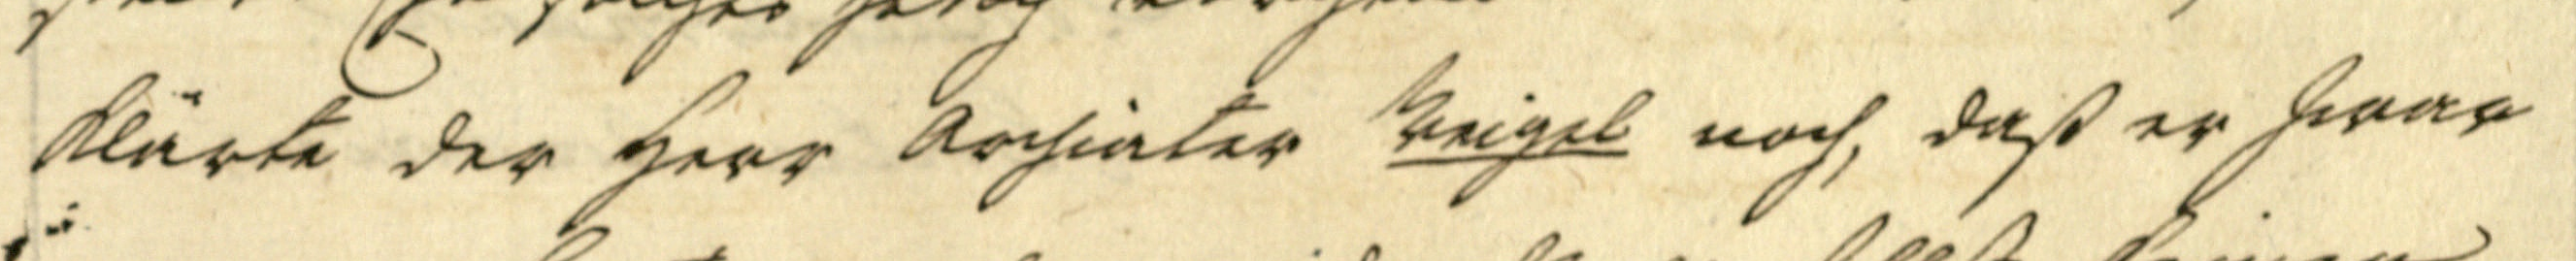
klärte der Herr Archiater Weigel noch, daß er zwar
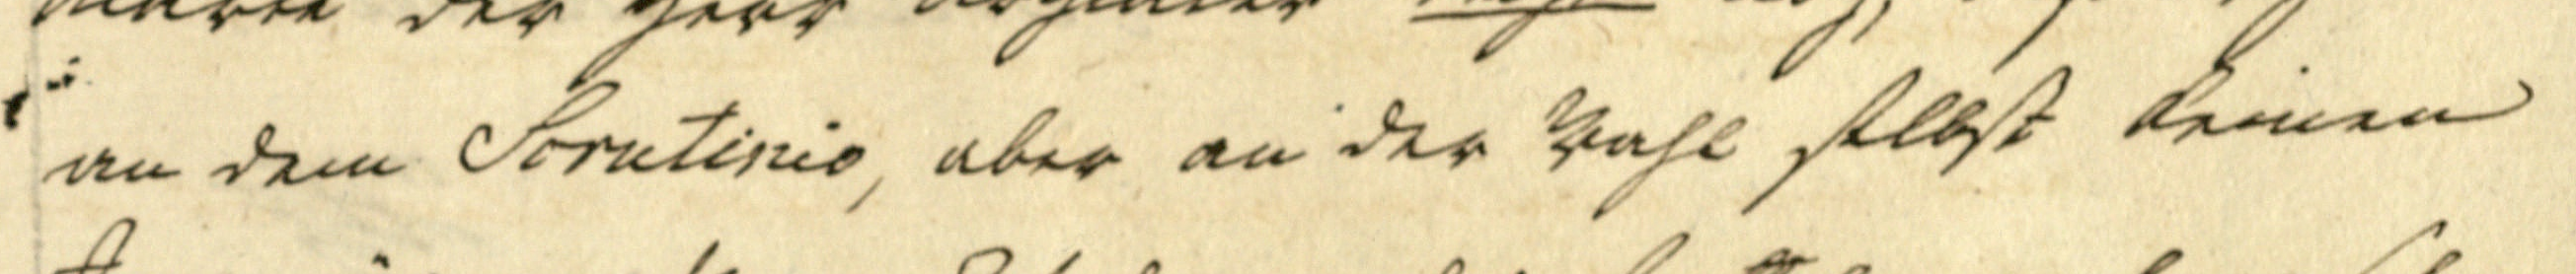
an dem Scrutinio, aber an der Wahl selbst keinen
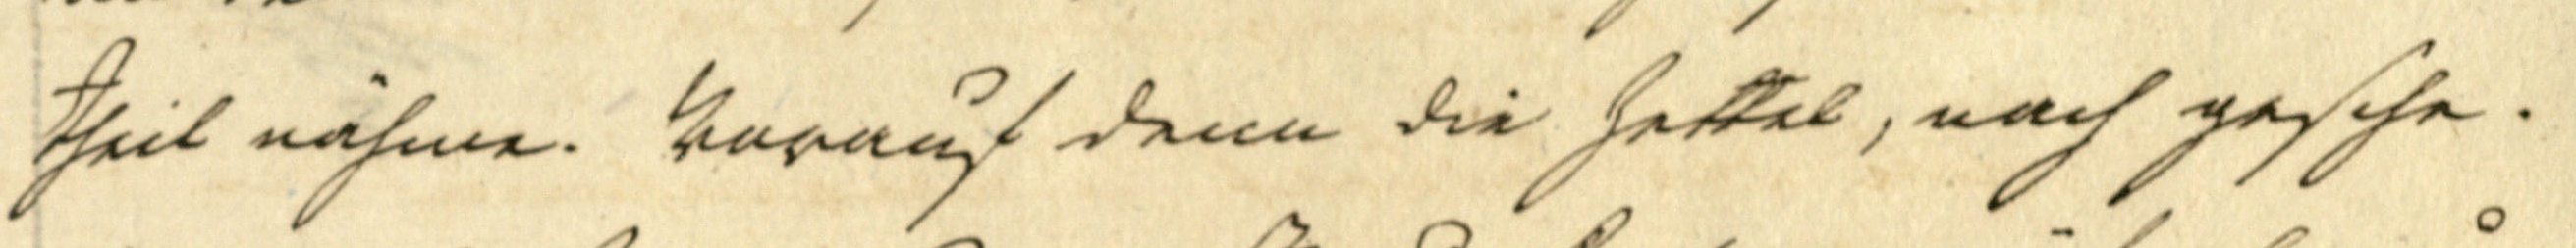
Theil nähme. Worauf denn die Zettel, nach gesche¬
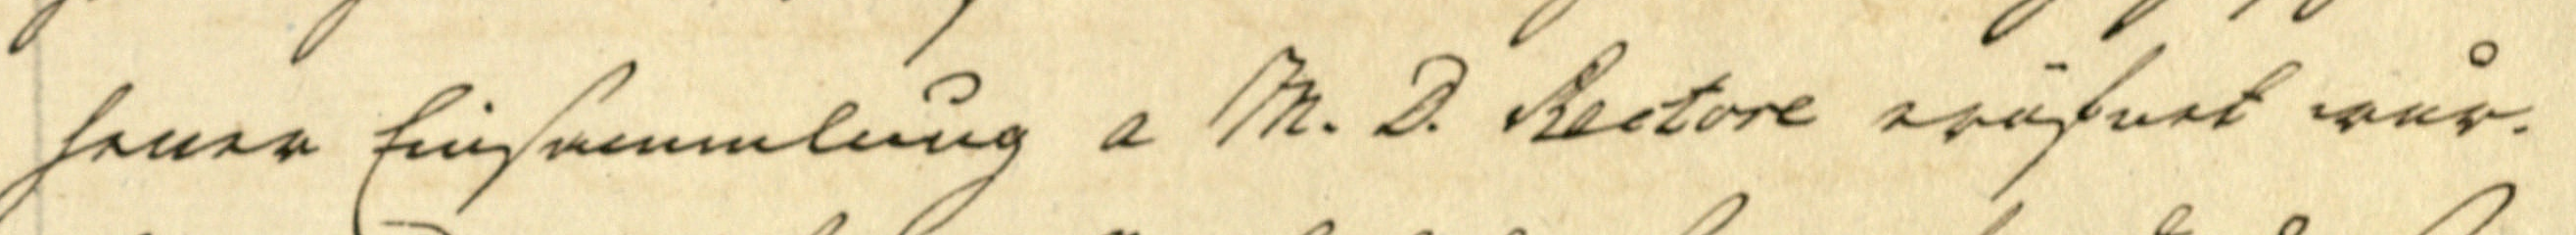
hener Einsammlung a M. D. Rectore eröfnet wur¬
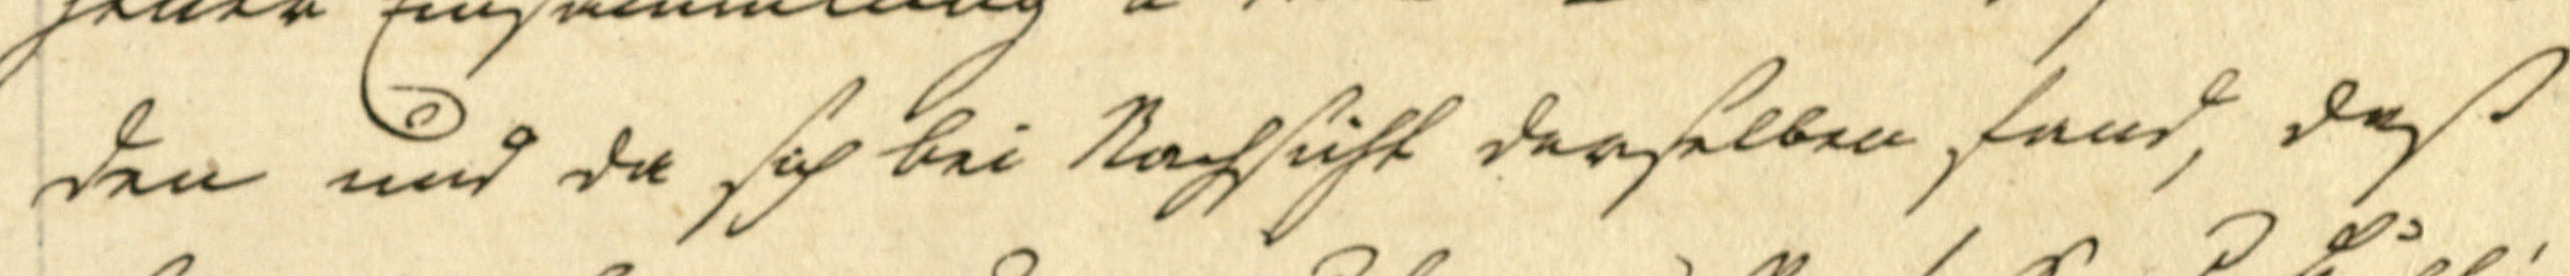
den und da sich bei Nachsicht derselben fand, daß
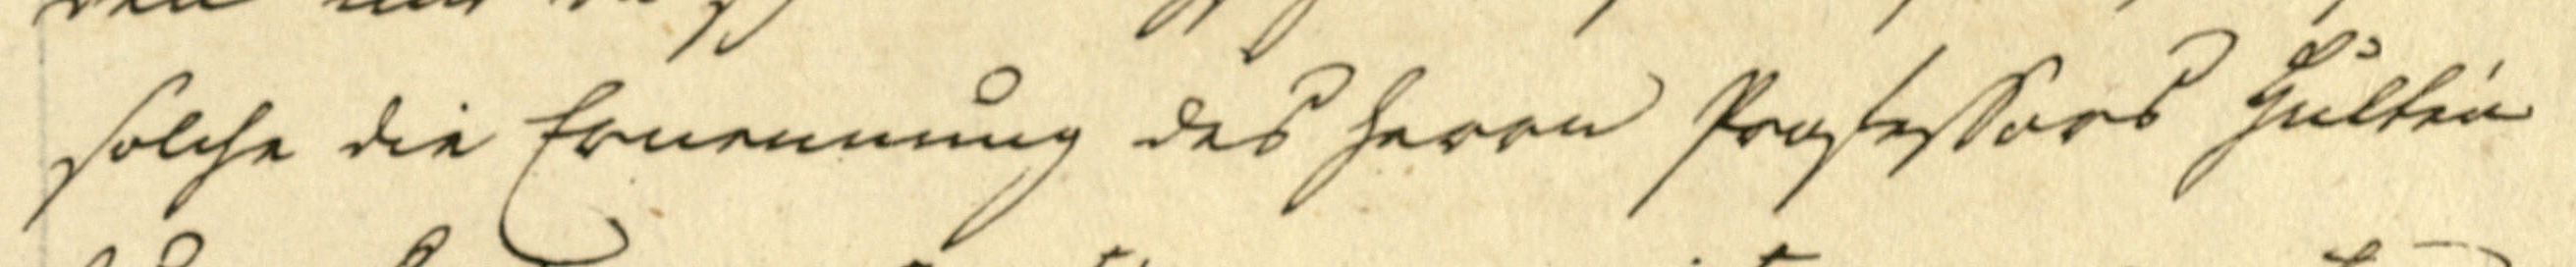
solche die Ernennung des Herrn Professors Hultén
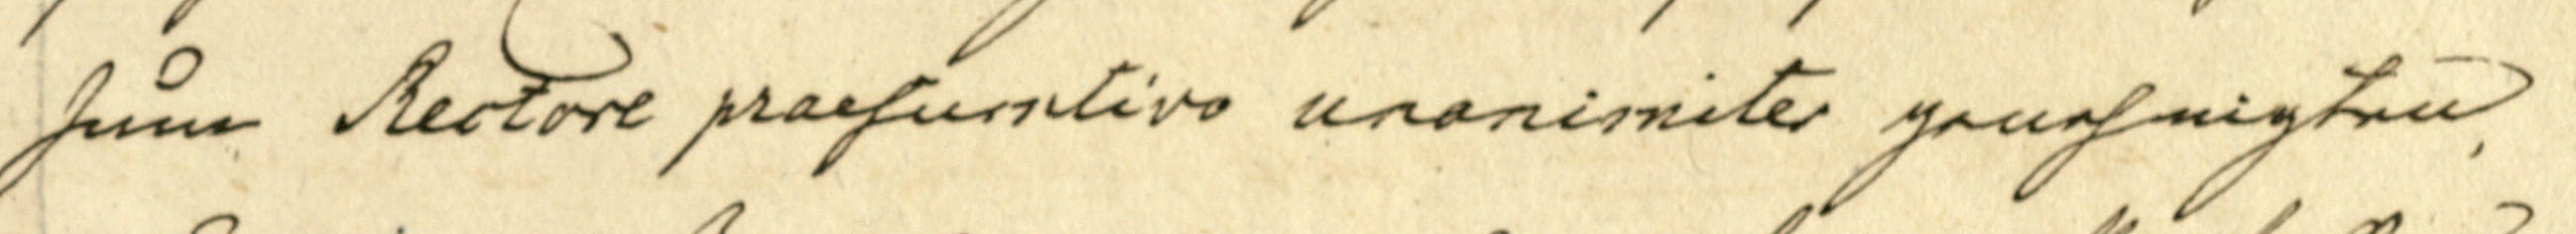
zum Rectore praesumtivo unanimiter genehmigten,
